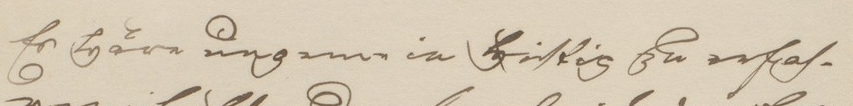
Es wäre ungemein wichtig zu erfah-
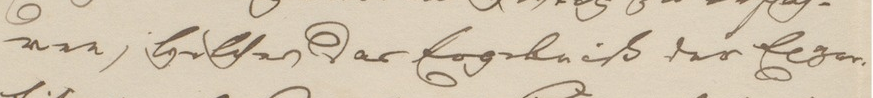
ren, welches das Ergebniß der Exper-
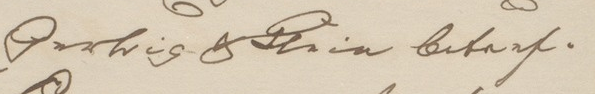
Gerwig & Klein betref-
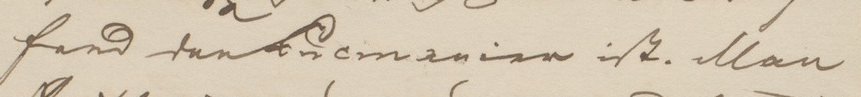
fend den Lucmanier ist. Man
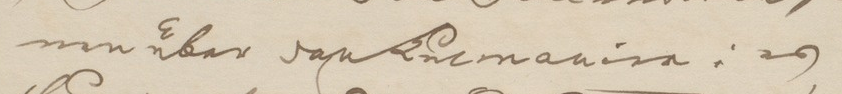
nen über den Lucmanier; es
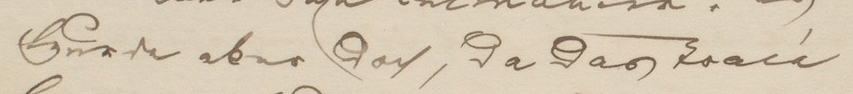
wurde aber doch, da das Tracé
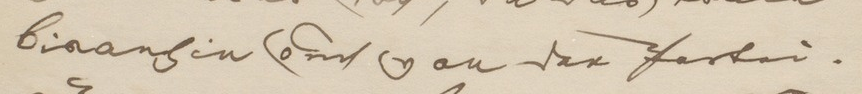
bisanhin auch von den Partei-
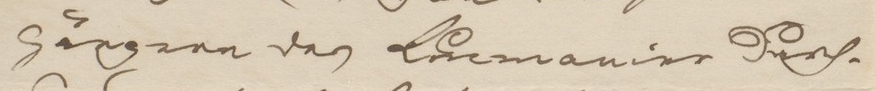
gängern des Lucmanier durch-
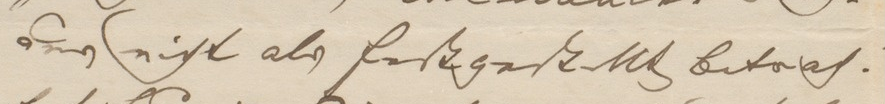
aus nicht als festgestellt betrach-
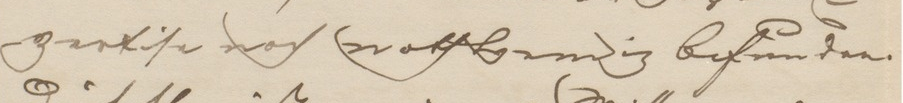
pertise noch nothwendig befunden.
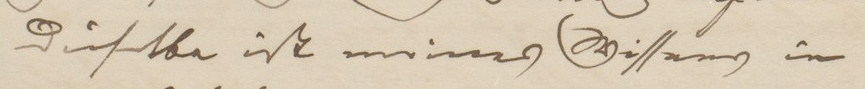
Dieselbe ist meines Wissens in
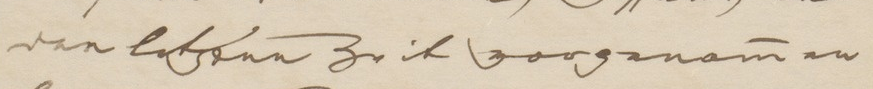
der letzten Zeit vorgenommen
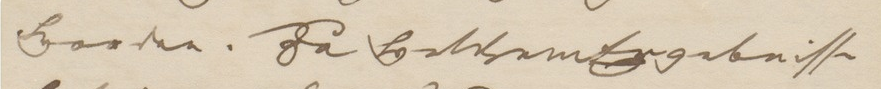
worden. Zu welchem Ergebnisse
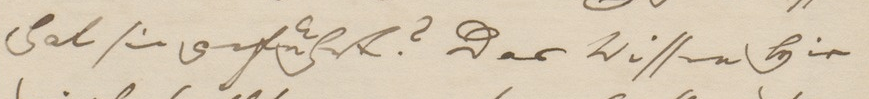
hat sie geführt? Das wissen wir
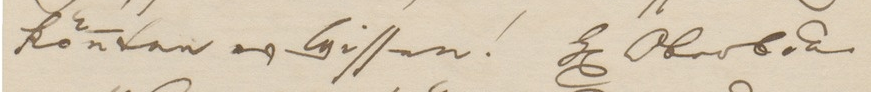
könnten es wissen! Herr Oberbau-
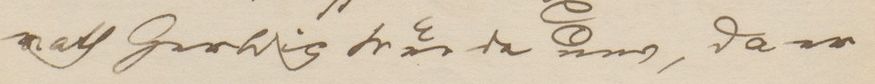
rath Gerwig würde uns, da er
